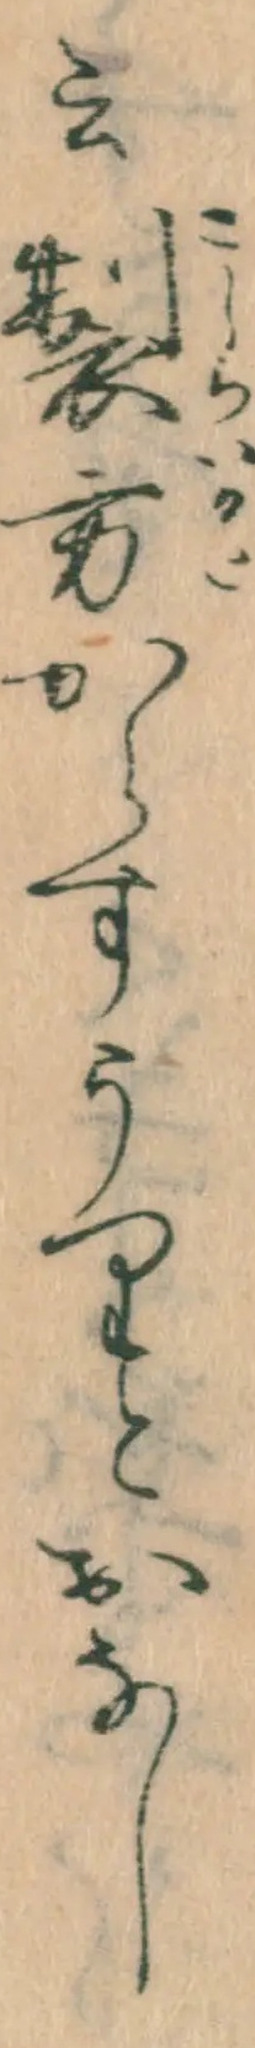云製方からすうりとおなし
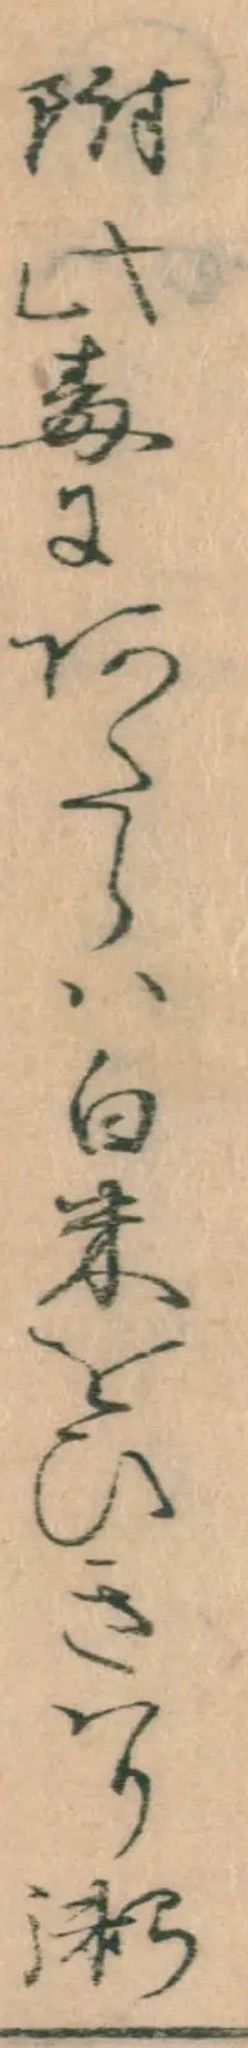附此毒にあたらは白米をひきわり粥
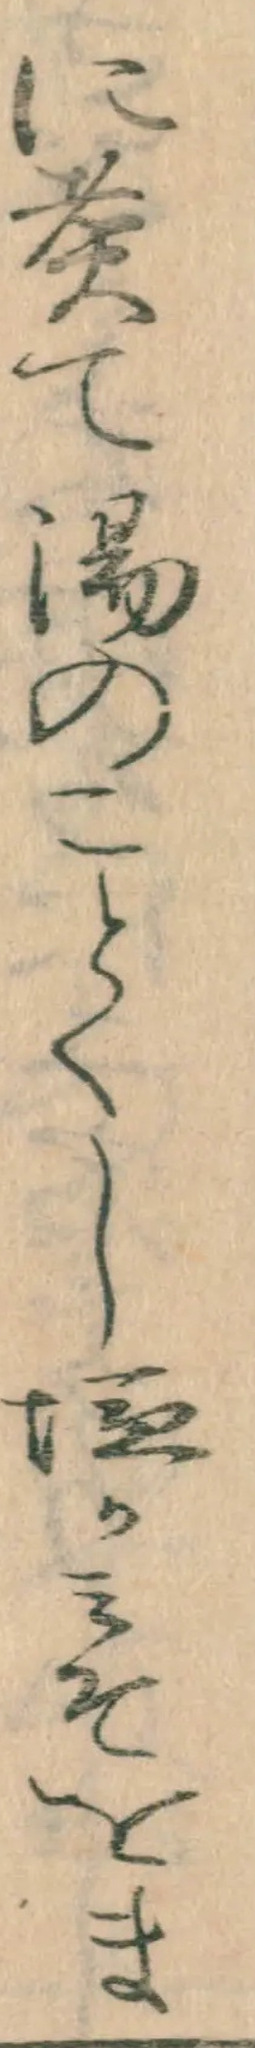に煮て湯のことくし塩かみそをま
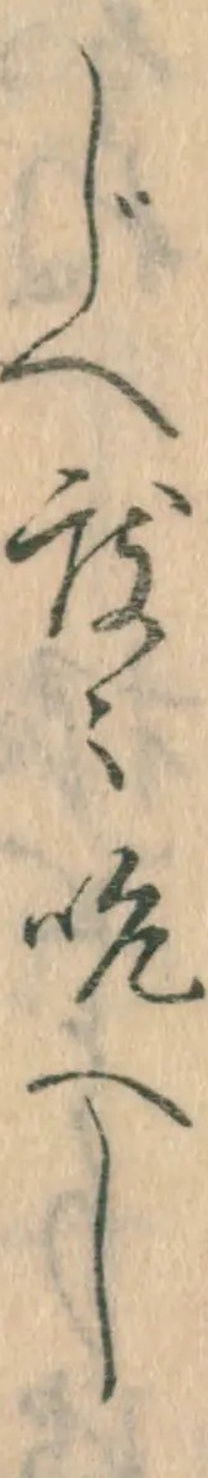じへ度々吮へし
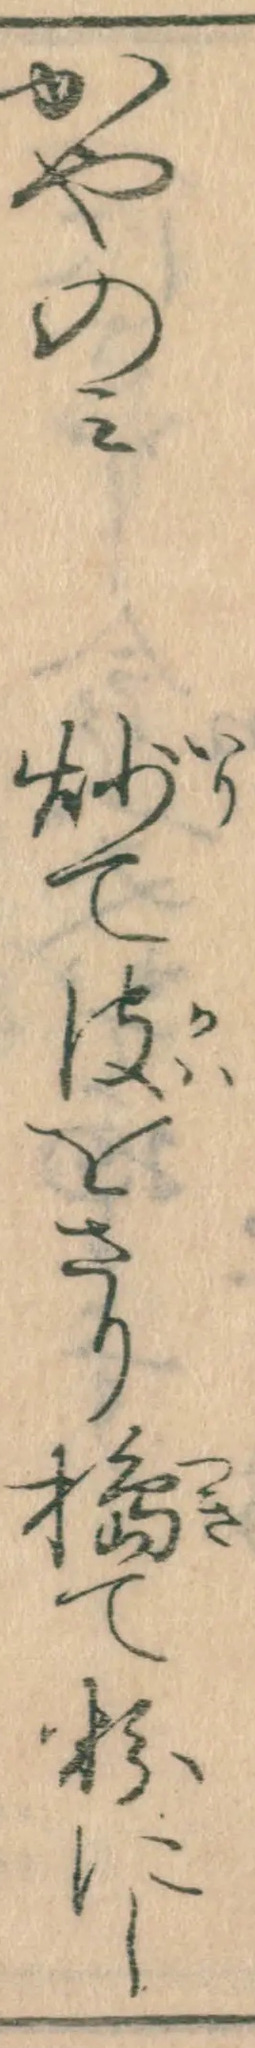かやのみ炒て皮をさり搗て粉にし
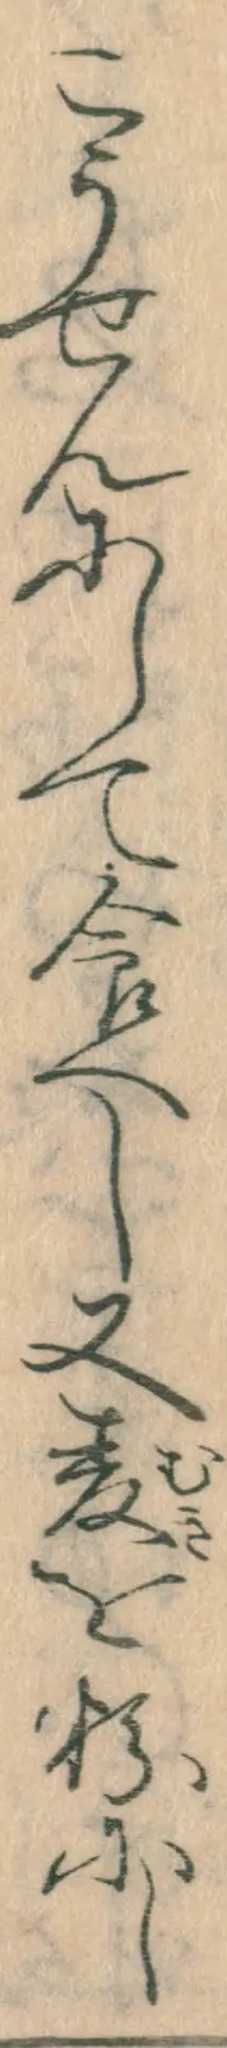こうせんにして食へし又麦を粉にし
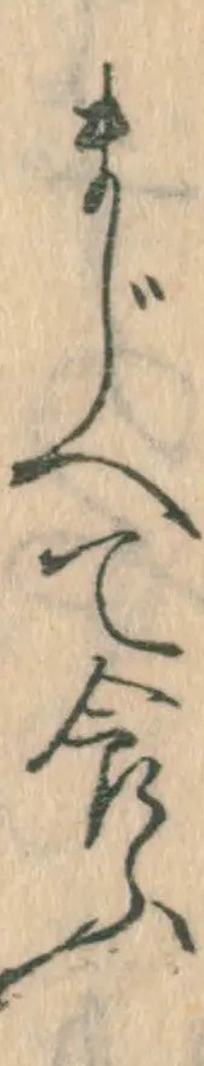まじへて食ふ
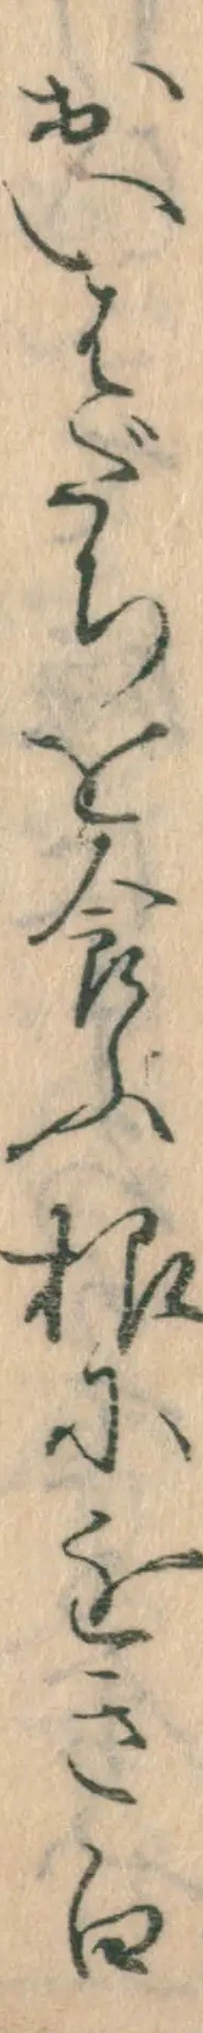がばおいはだちを食ふ根に近き白
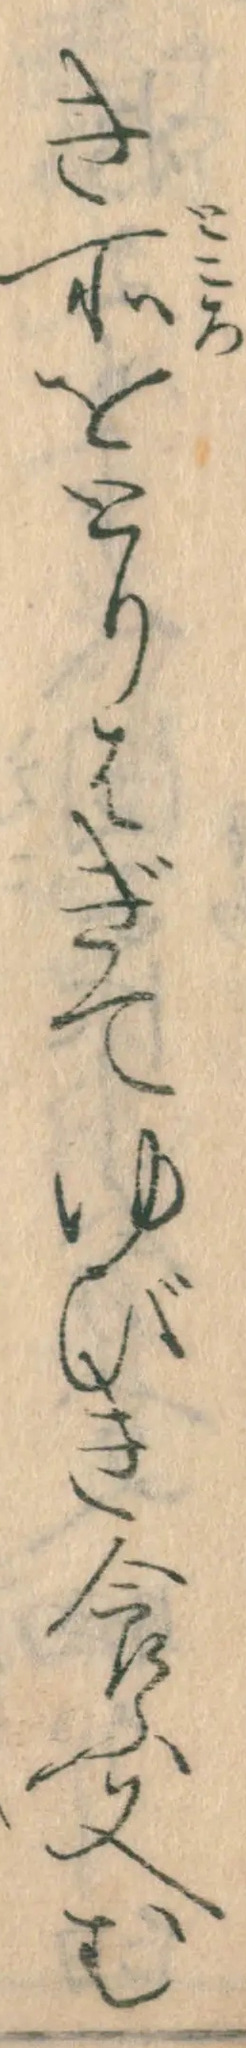き所をとりはぎてゆびき食ふ又む
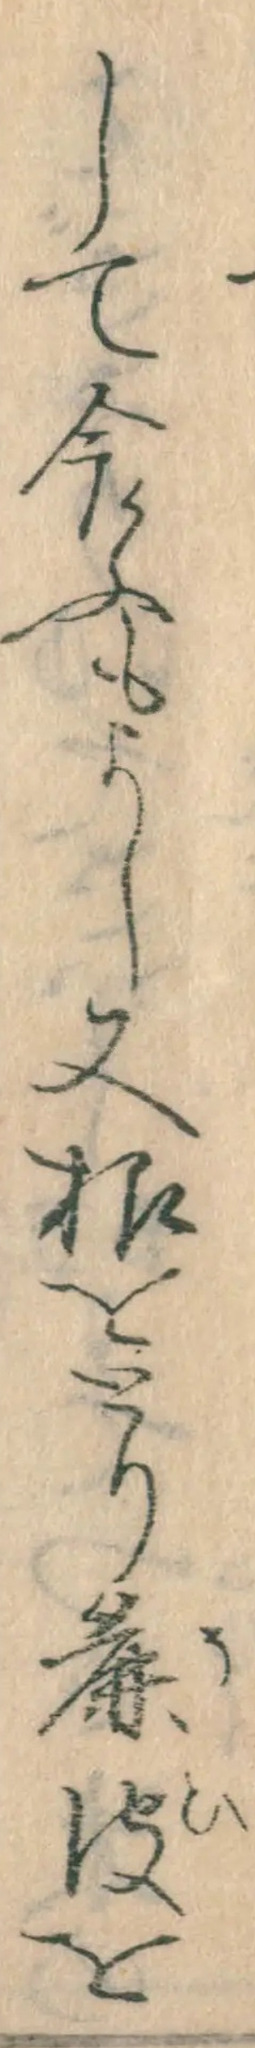して食ふもよし又根をとり麁皮を

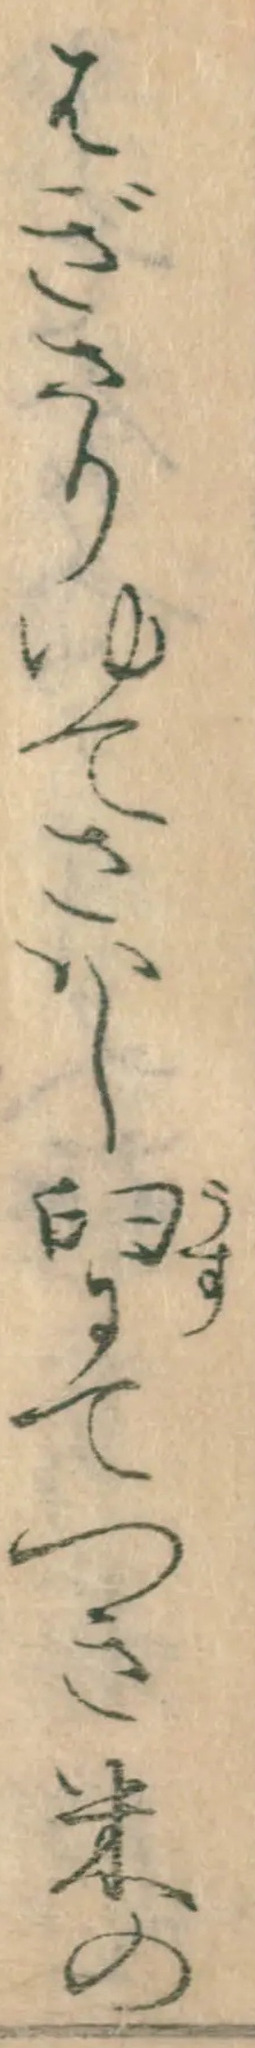はぎさりゆてさはし臼にてつき米の
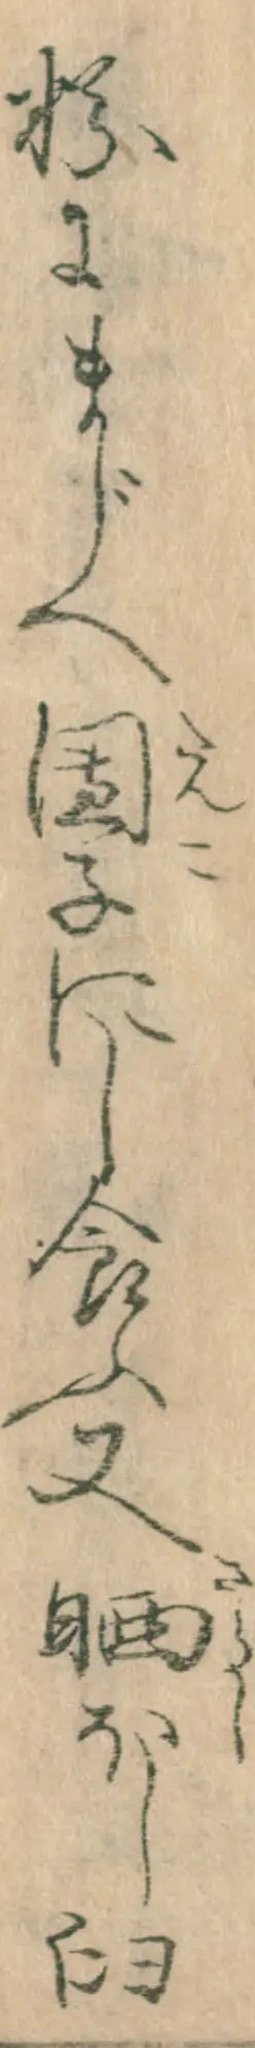粉にまじへ団子にし食ふ又晒ほし臼
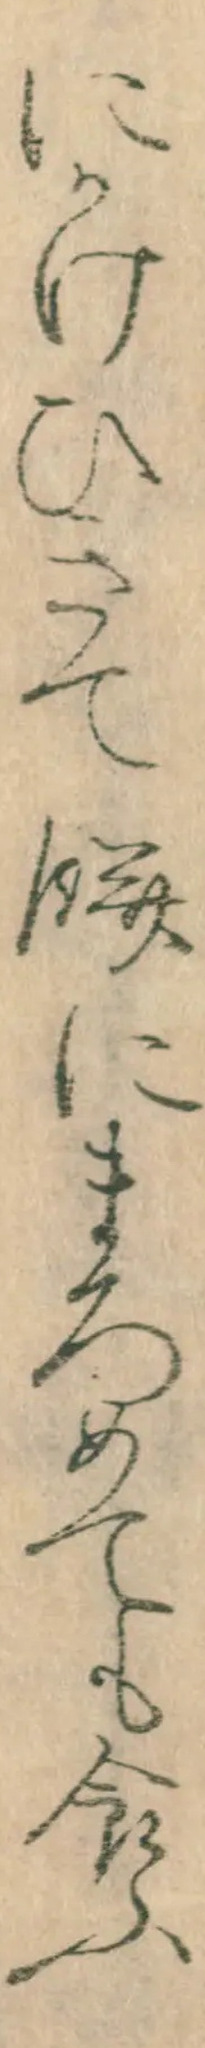にかけひきて餅にまろめても食ふ
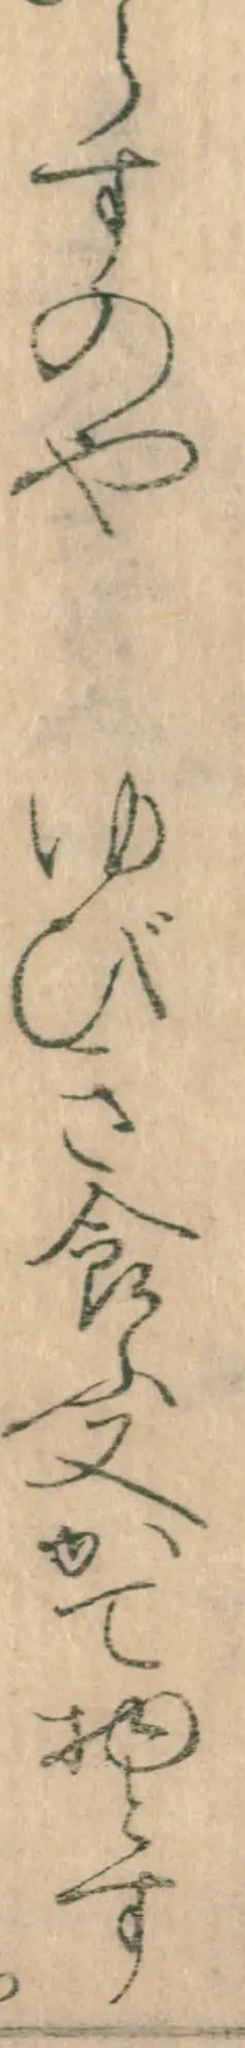からすのやゆびき食ふ又かて物とす
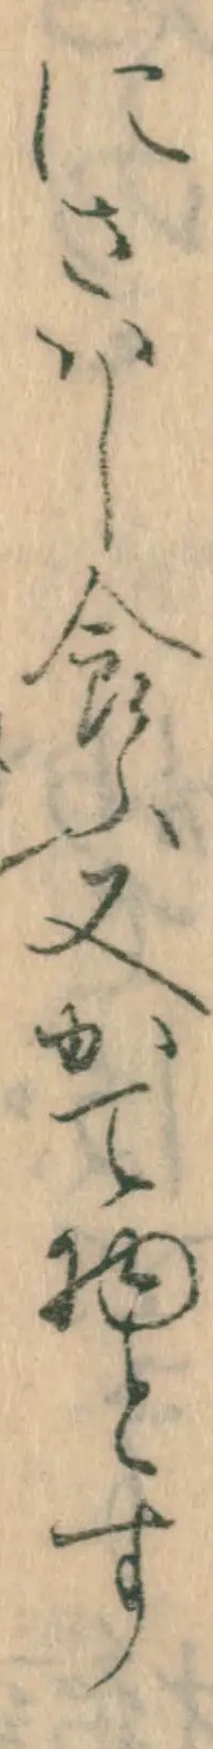にさはし食ふ又かて物とす
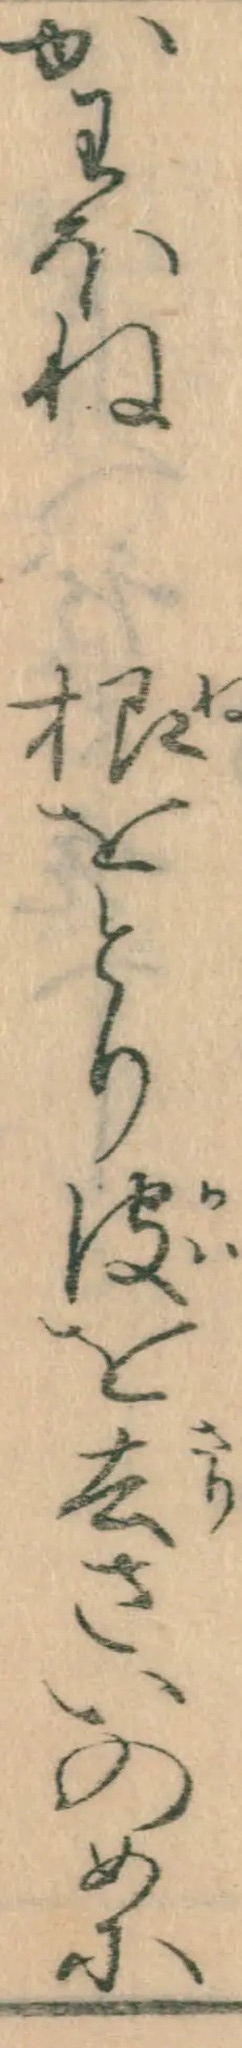かわほね根をとり皮を去さいのめに
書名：かてもの
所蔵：国立国会図書館 National Diet Library, JAPAN
